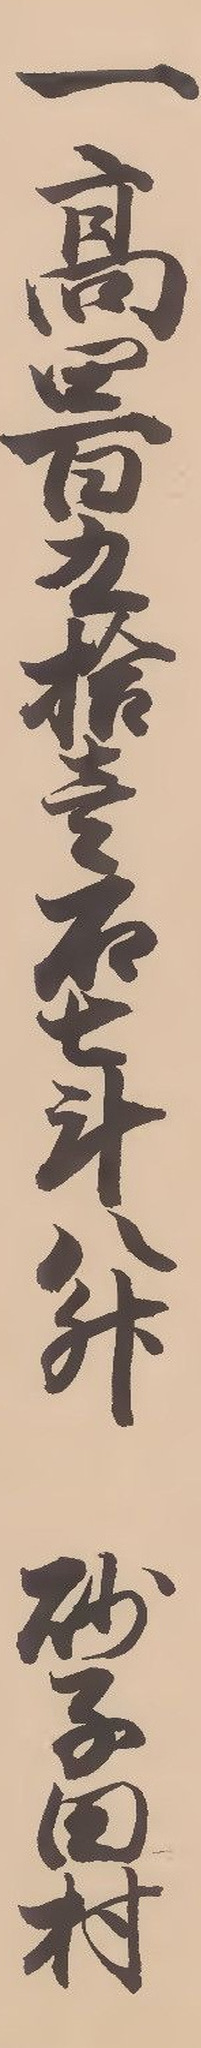一高四百九拾壱石七斗八升砂子田村
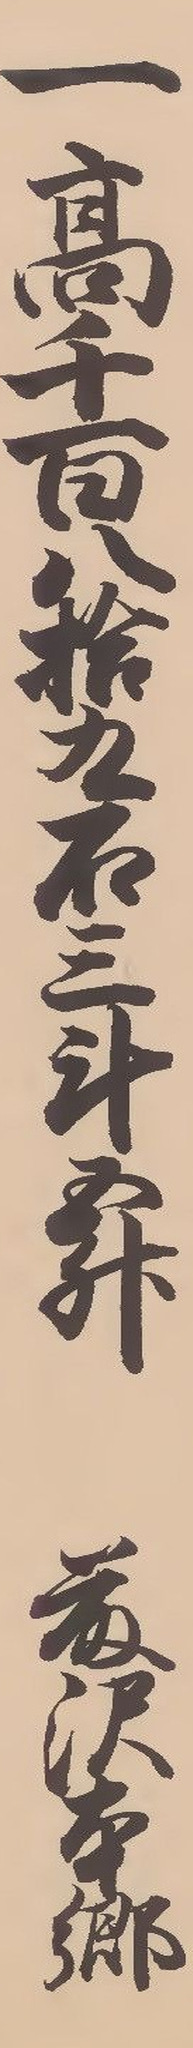一高千百八拾九石三斗五升藤沢本郷
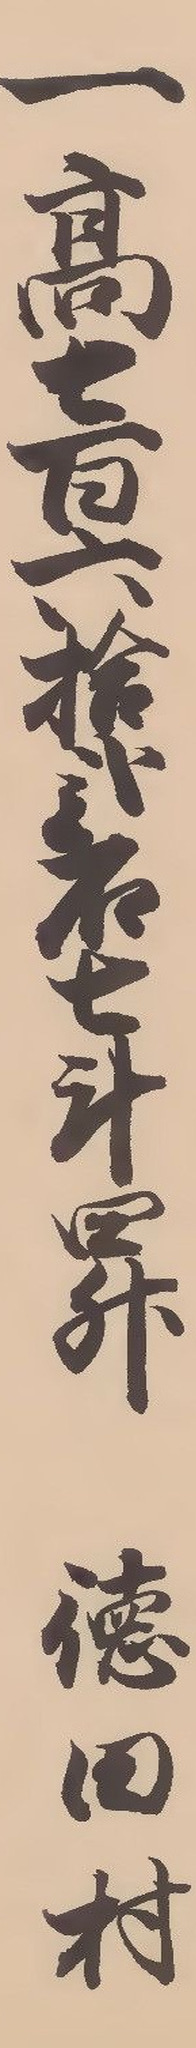一高七百六拾弐石七斗四升徳田村
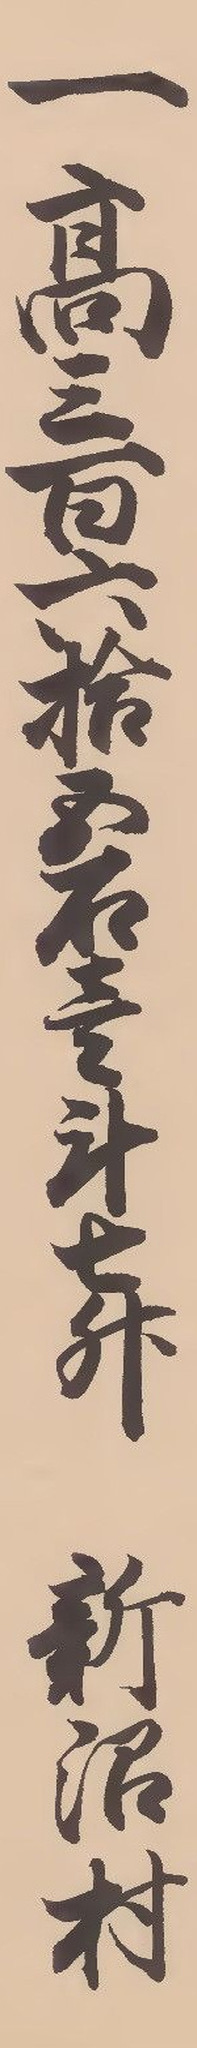一高三百六拾五石壱斗七升新沼村
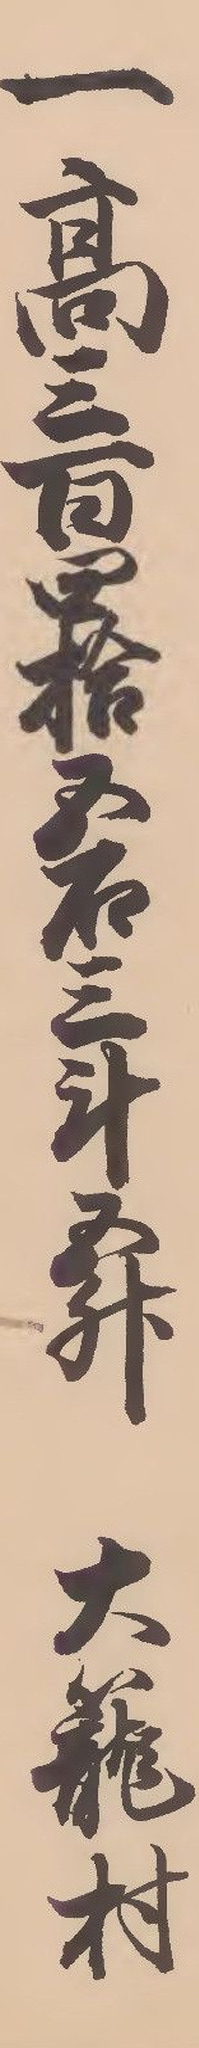一高三百四拾五石三斗五升大篭村

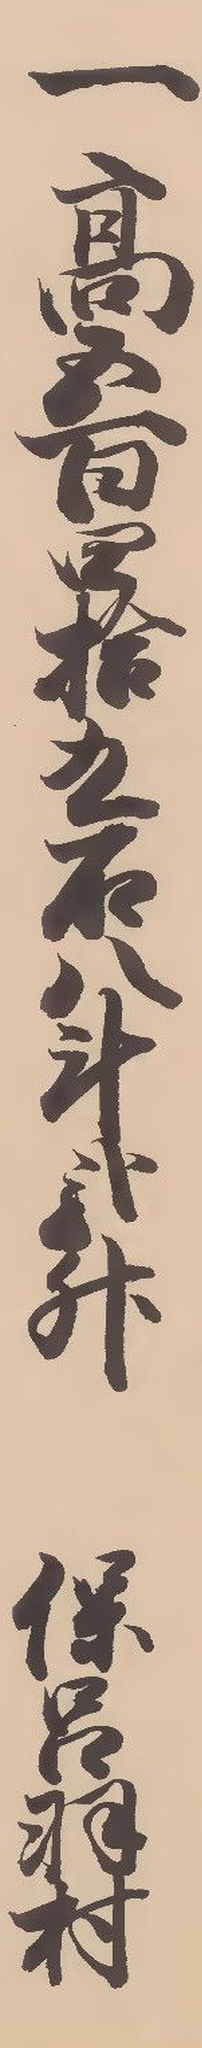一高五百四拾九石八斗弐升保呂羽村
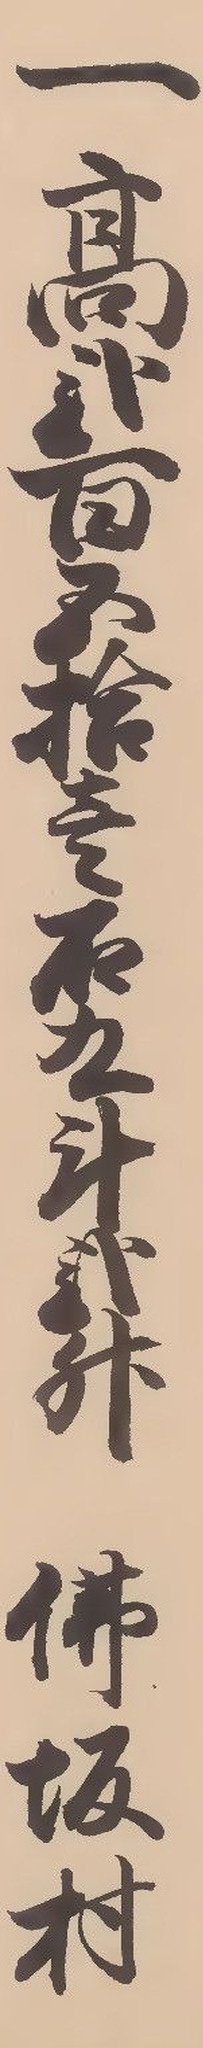一高弐百五拾壱石九斗弐升仏坂村
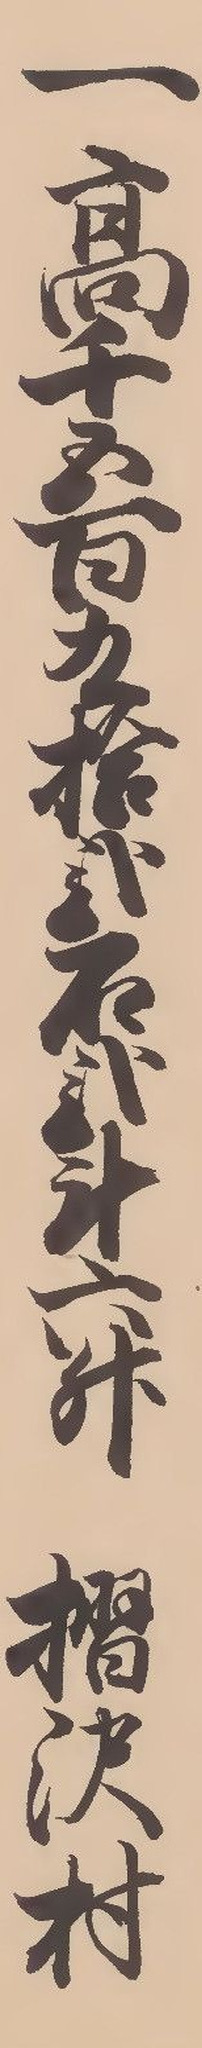一高千五百九拾弐石弐斗六升摺沢村
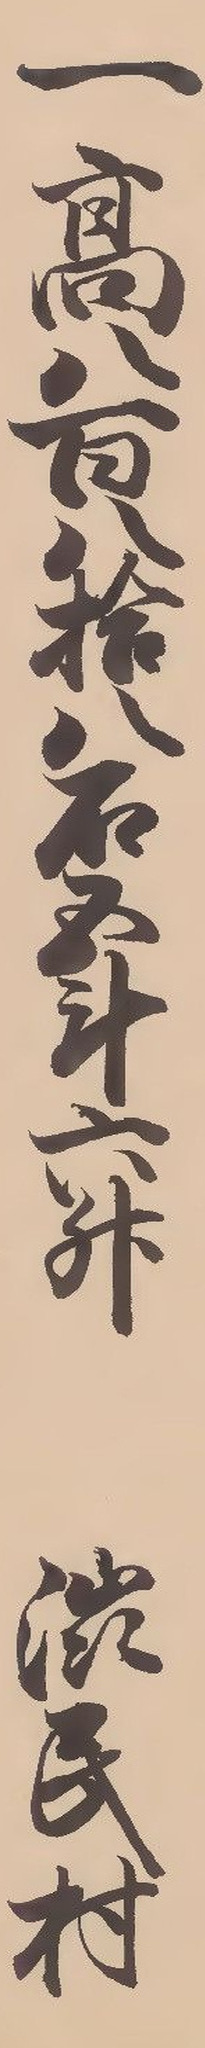一高八百八拾八石五斗六升渋民村
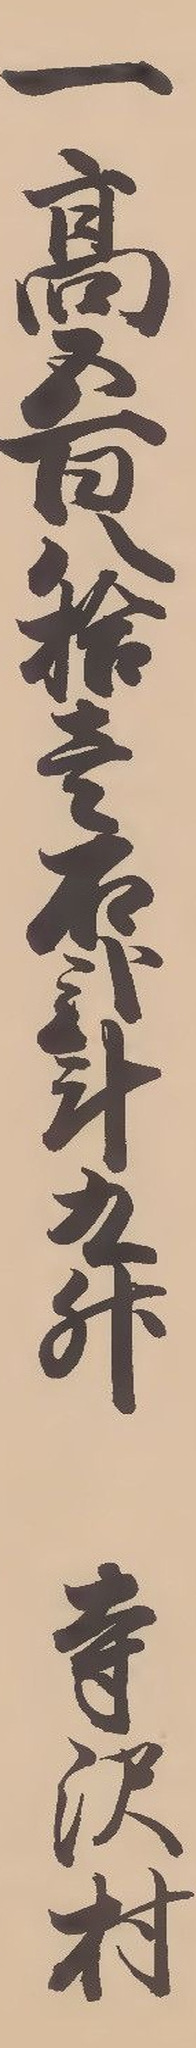一高五百八拾壱石弐斗九升寺沢村
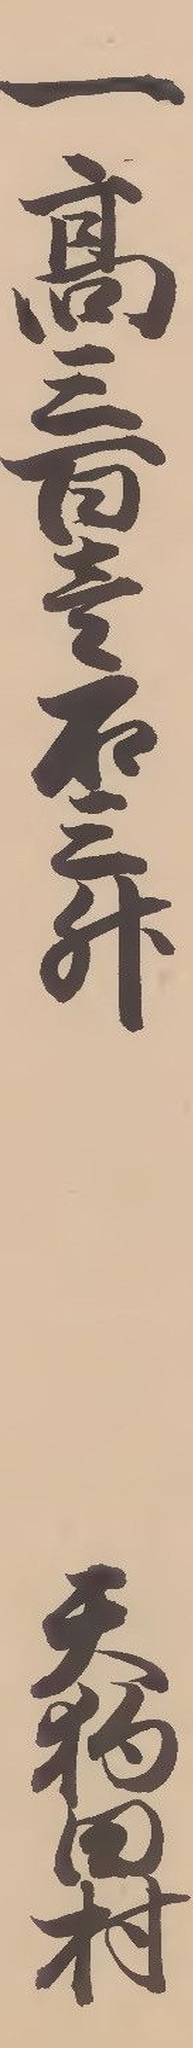一高三百壱石三升天狗田村
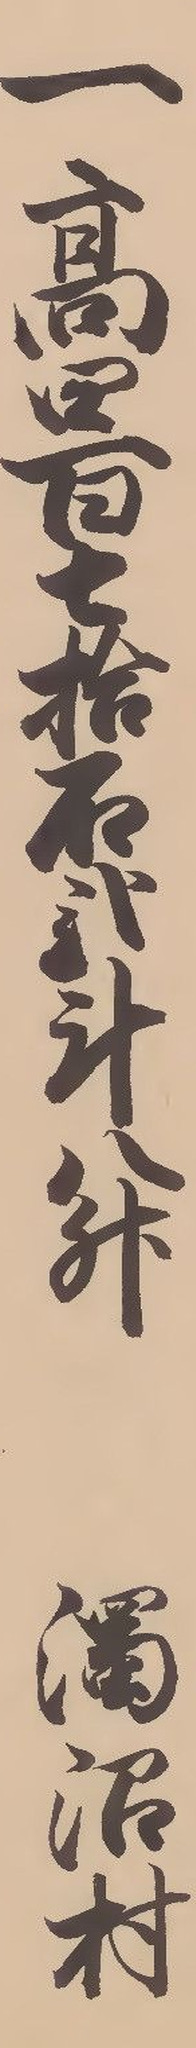一高四百七拾石弐斗八升濁沼村
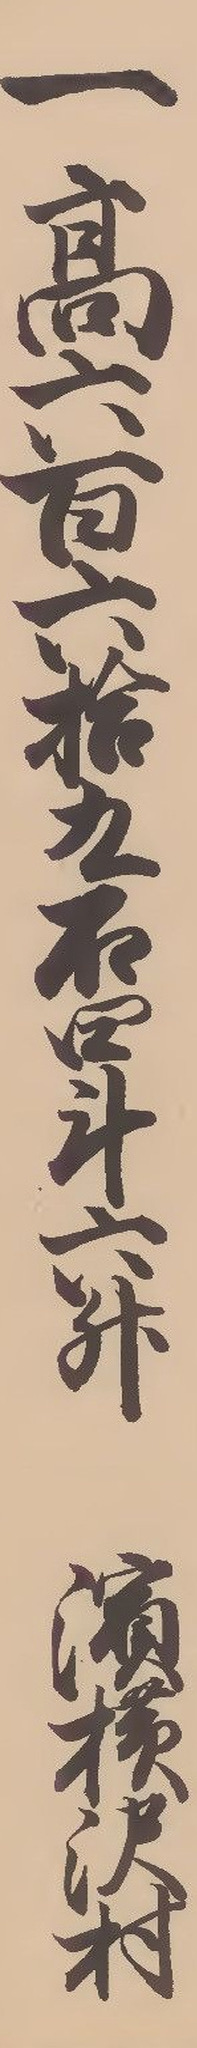一高六百六拾九石四斗六升浜横沢村

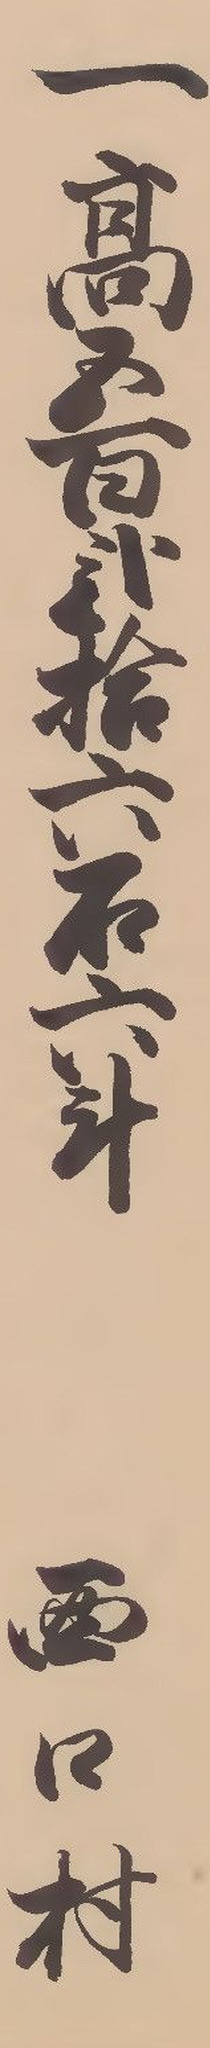一高五百弐拾六石六斗西口村
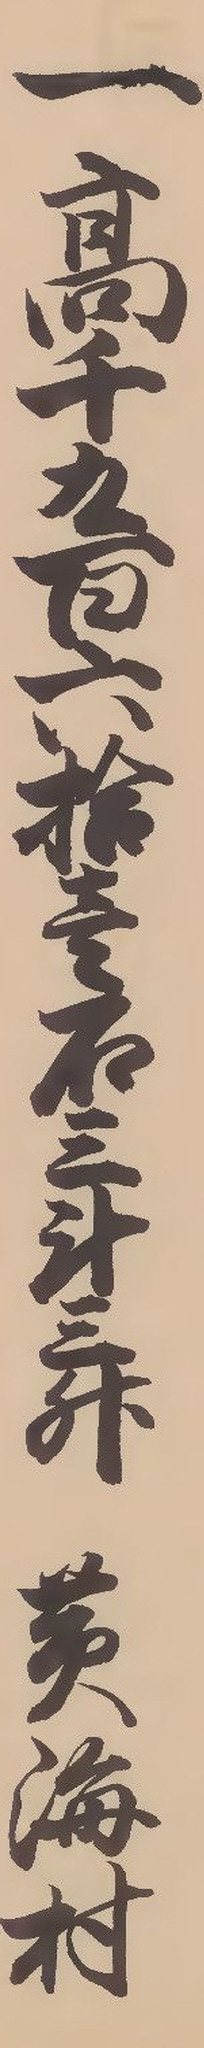一高千九百六拾壱石三斗三升黄海村
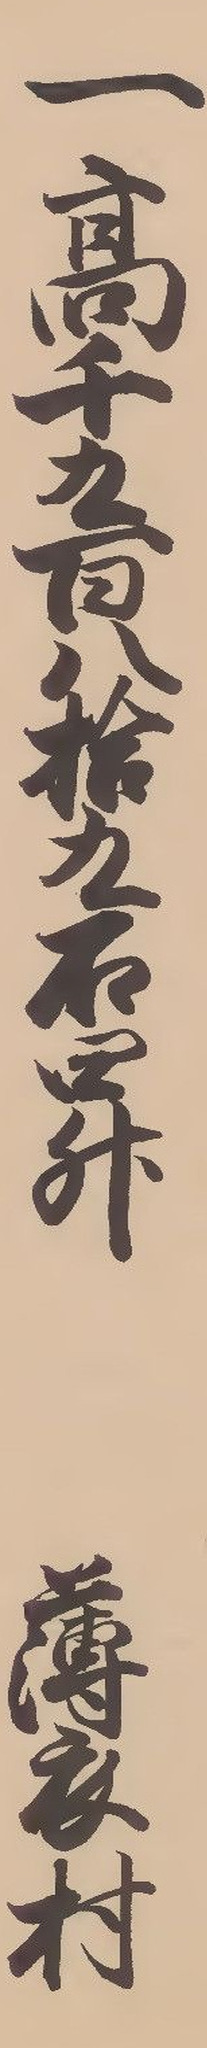一高千九百八拾九石四升薄衣村
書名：陸奥国郷帳　５
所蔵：国立公文書館 National Archives of Japan
